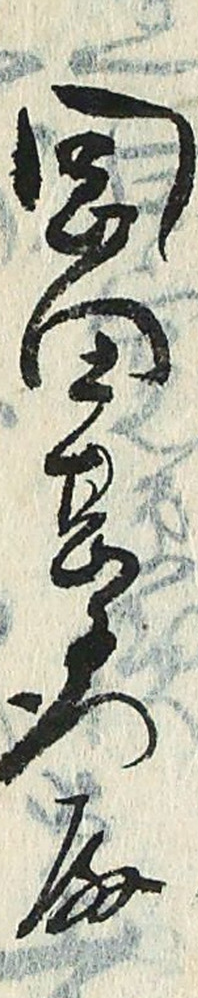岡田甚右衛門殿
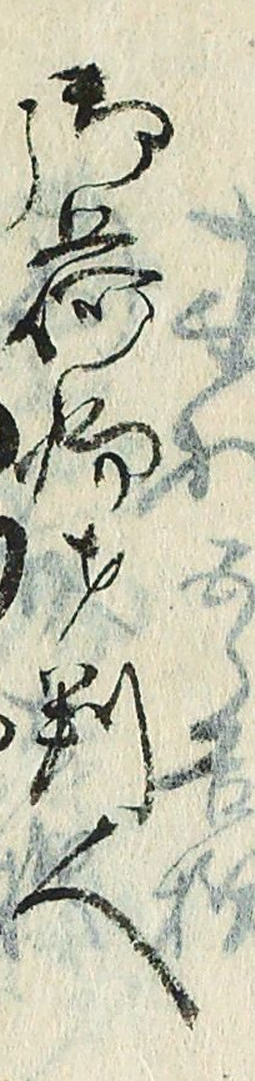御荷物才判人
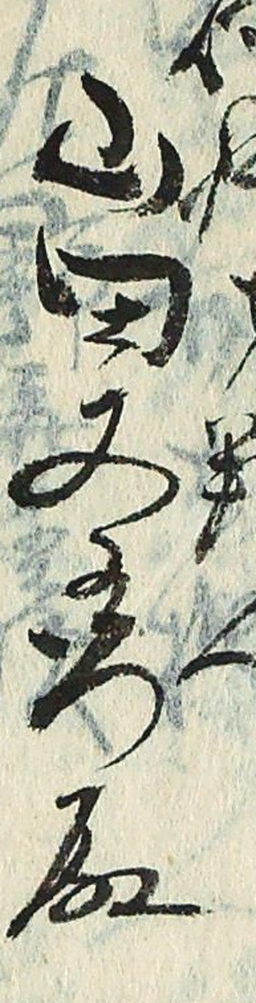山田又右衛門殿
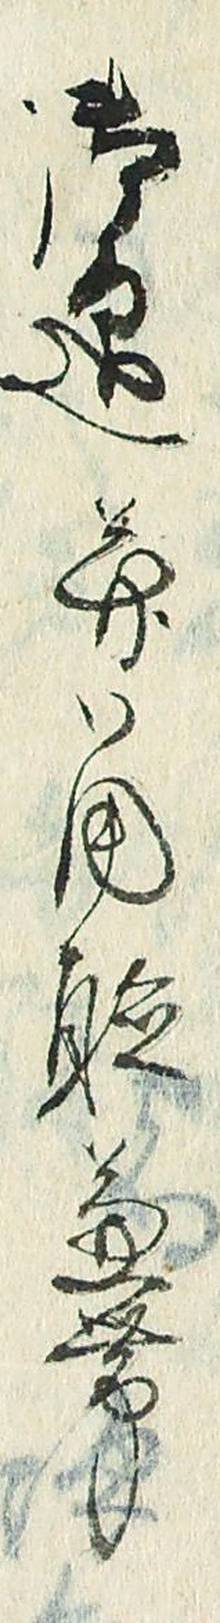御迎并御用聴兼帯
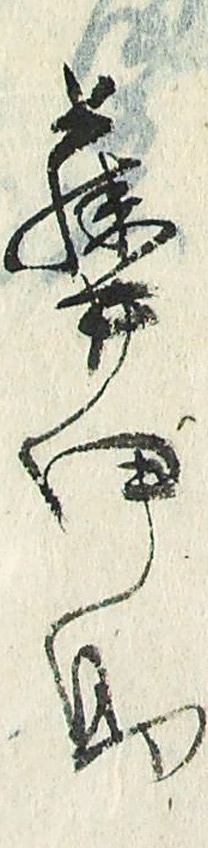藤井伊助

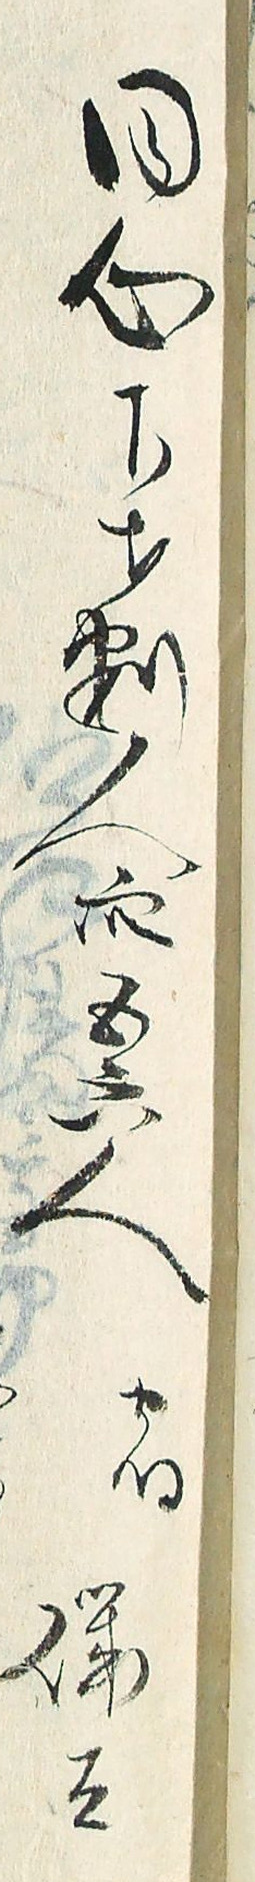同心下才判人衆五六人磯太
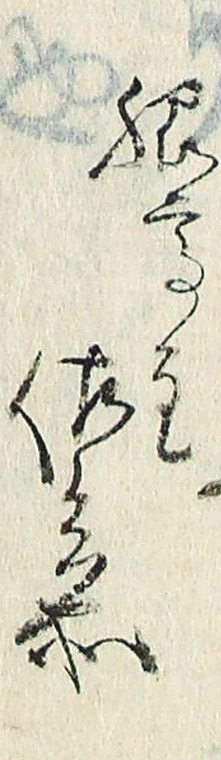佐兵衛
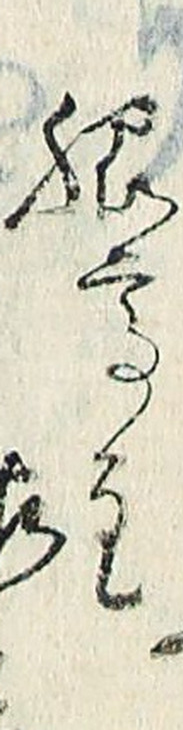脇亭主
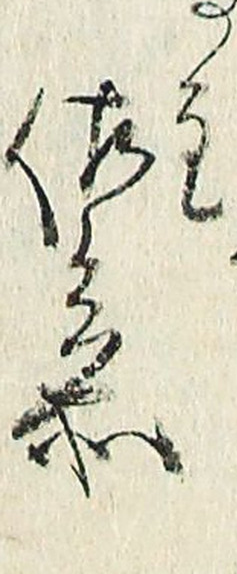佐兵衛
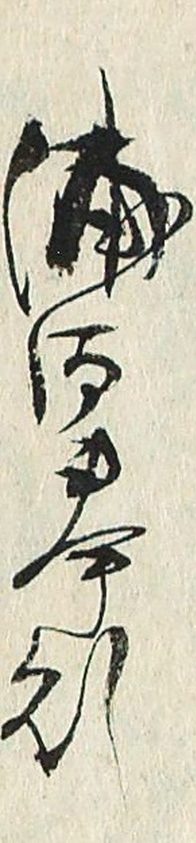浦御奉行
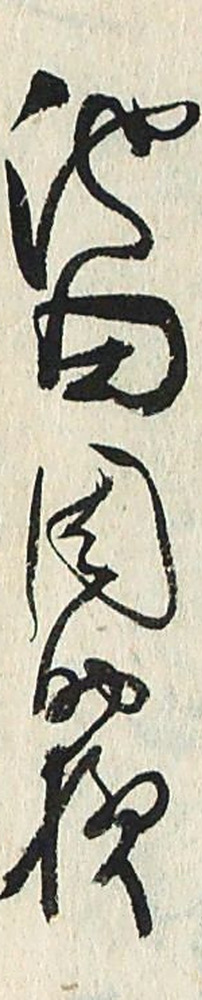池田周助様
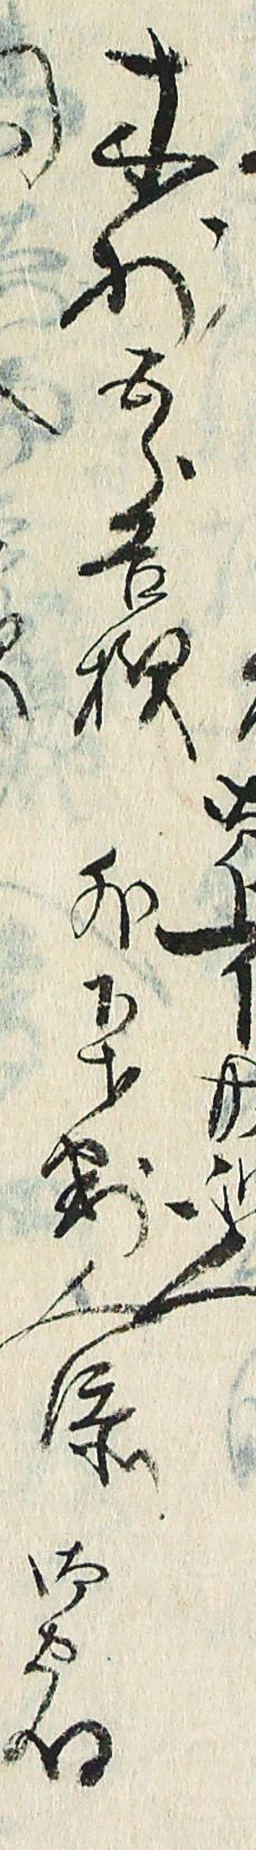岡竹七様外下才判人添御宿
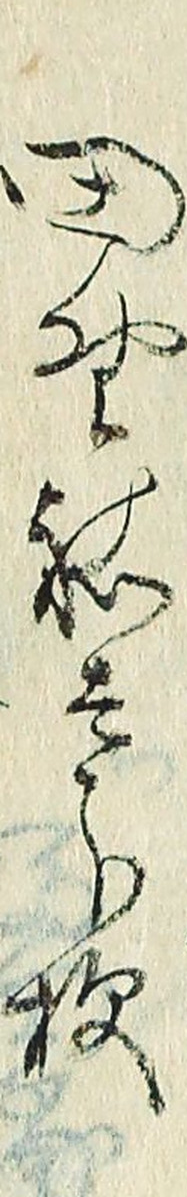田野祐太郎様鍋助
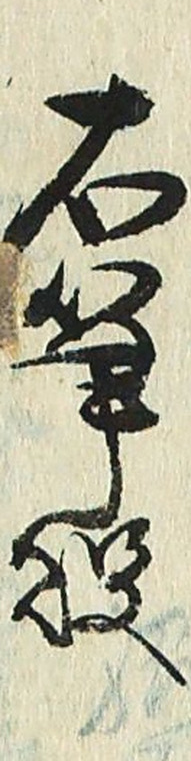右筆役
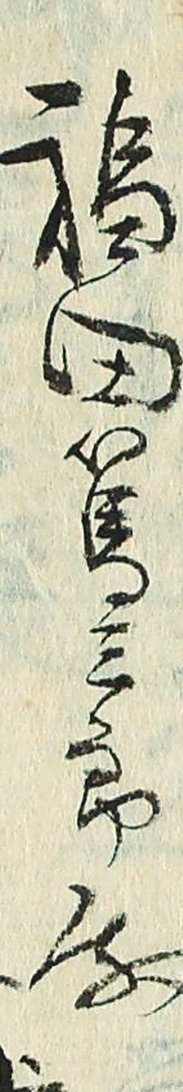福田篤三郎殿宿
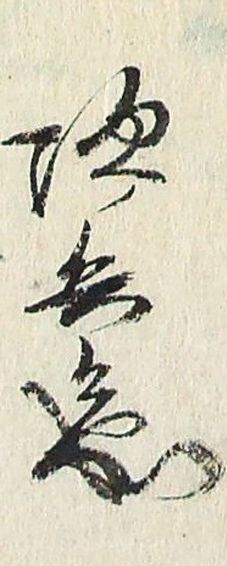佐兵衛
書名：公辺御役人為御廻浦御立越諸御用一巻
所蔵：鳴門教育大学 Naruto University of Education
